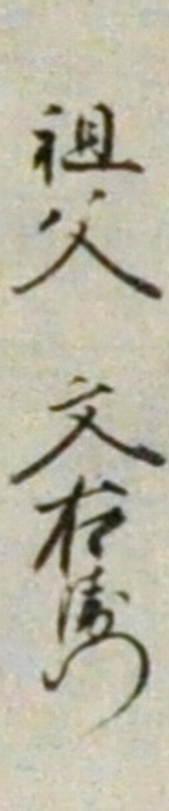祖父文右衛門
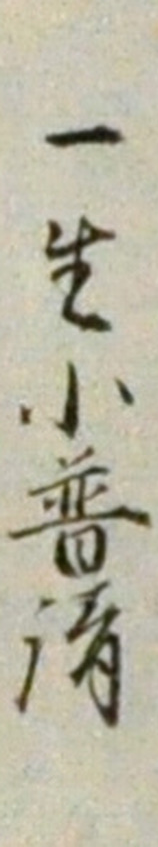一生小普請
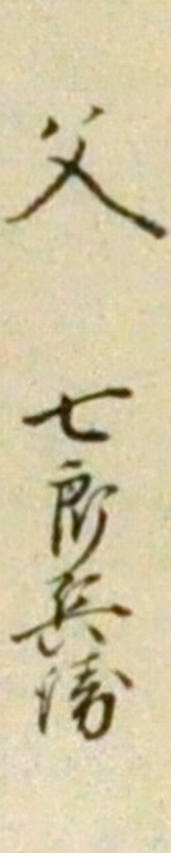父七郎兵衛
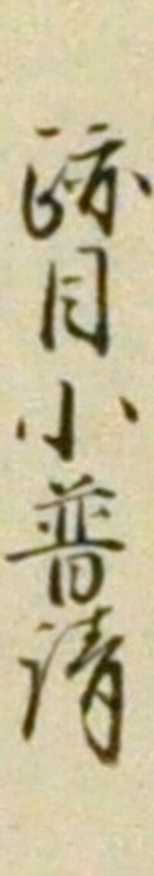跡目小普請
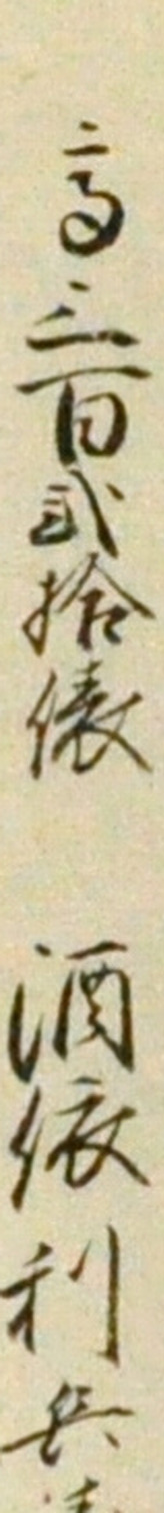高三百弐拾俵酒依利兵衛
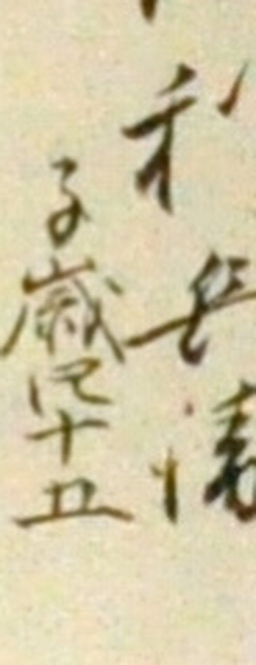子歳四十五

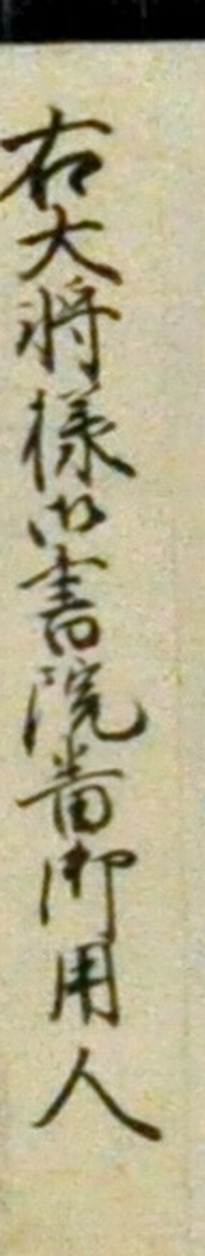右大将様御書院番御用人
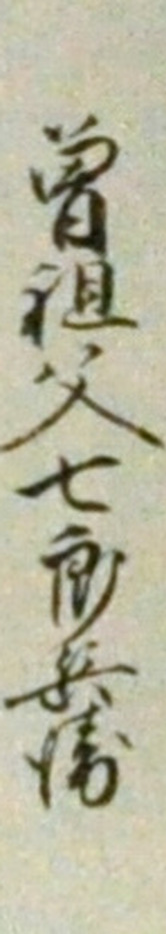曽祖父七郎兵衛
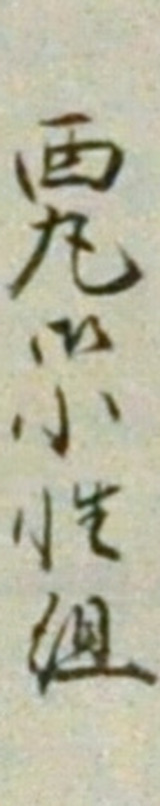西丸御小姓組
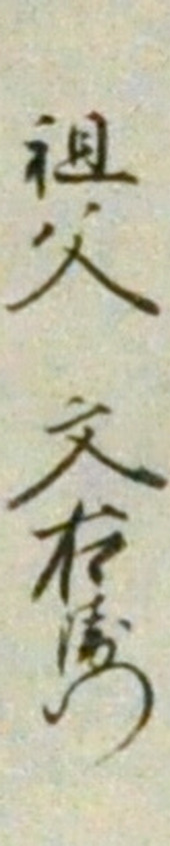祖父文右衛門
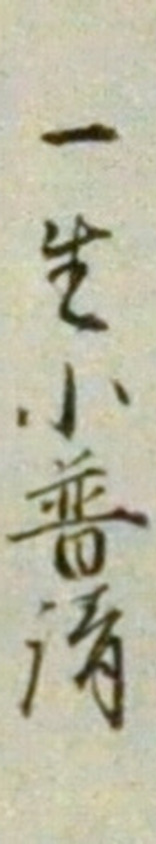一生小普請
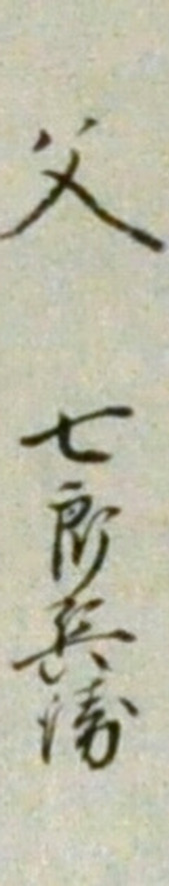父七郎兵衛
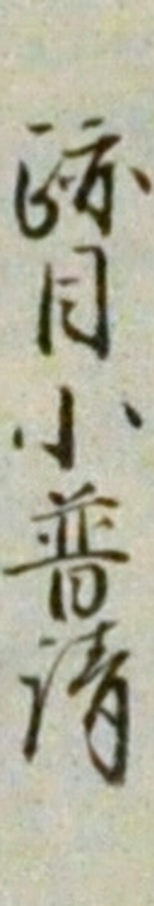跡目小普請
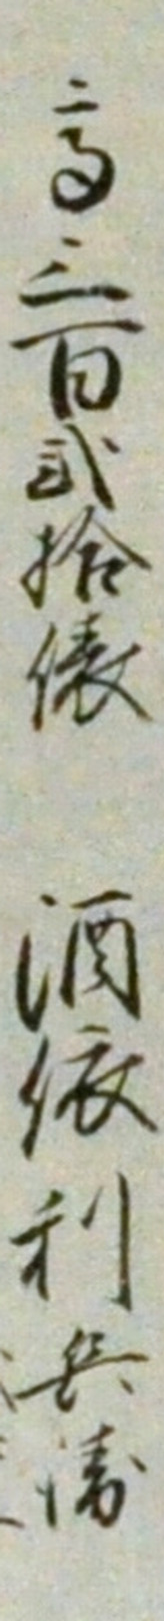高三百弐拾俵酒依利兵衛
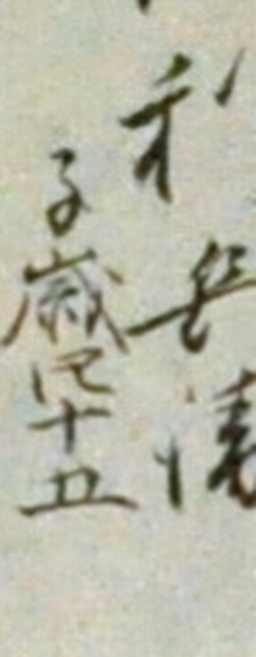子歳四十五
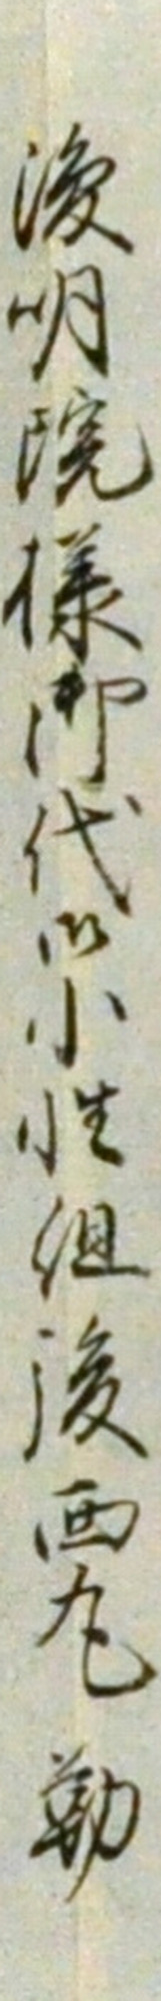浚明院様御代御小姓組後西丸勤
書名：若年寄御役中御調書付
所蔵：伊那市立高遠町図書館・合同会社AMANE
